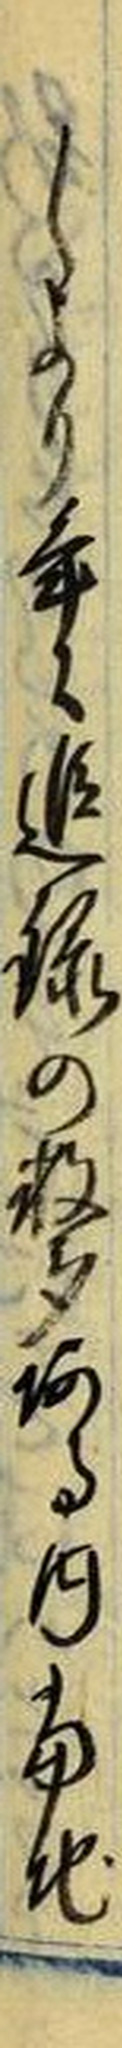しより年々追録の数多ある内当地
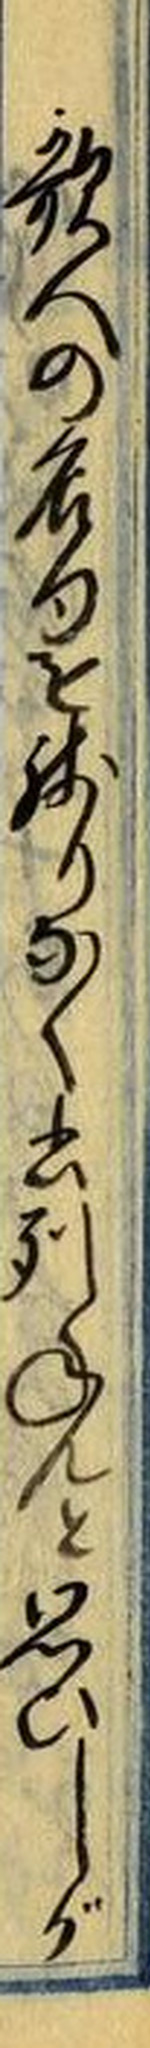歌人の名句を残りなく書列ねんと思いひしが
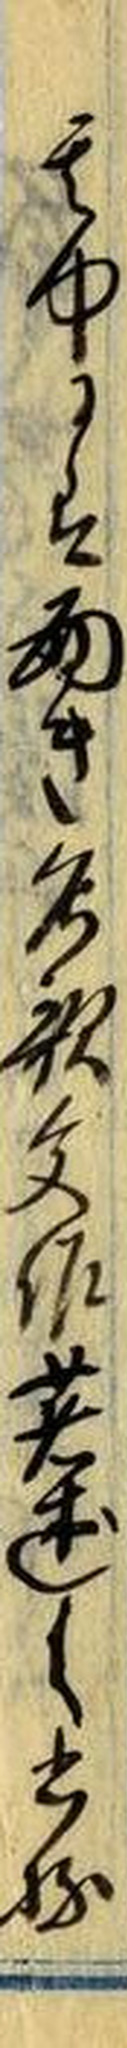其中には緬き名歌文作著述之書抔
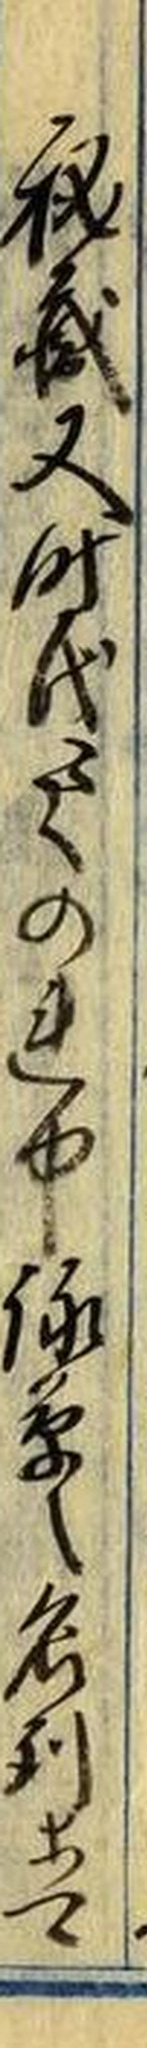秘蔵又時代々々の連中詠草之名列等可
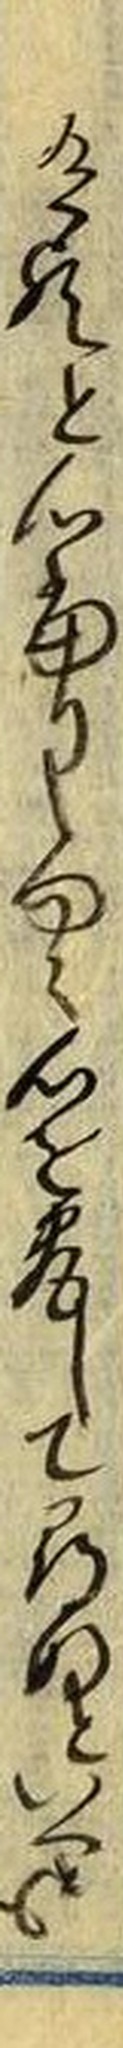有歟と心当り之向々心を尽して尋ぬといへとも
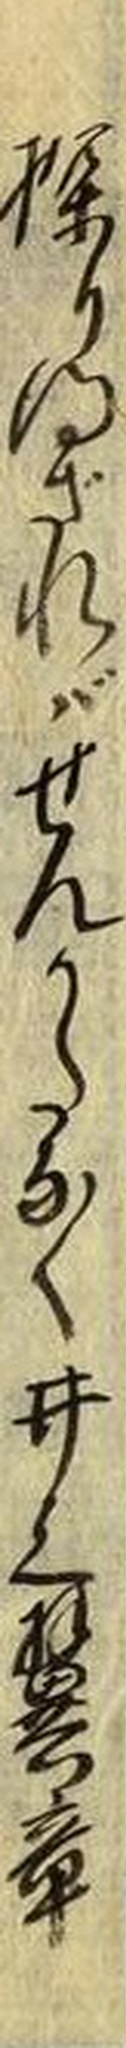探り得ざればせんかたなく井上翼章
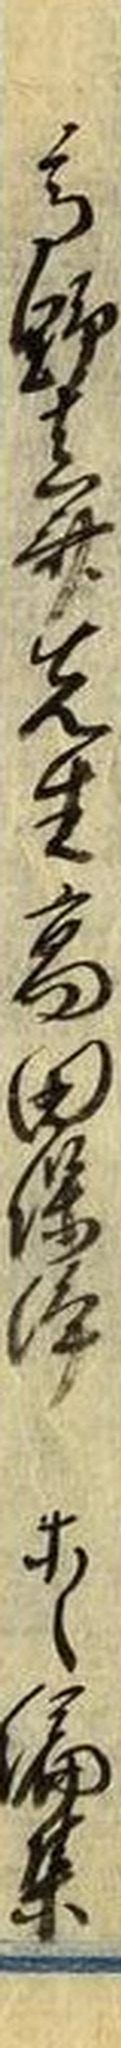高野真斎先生高田保浄等之編集
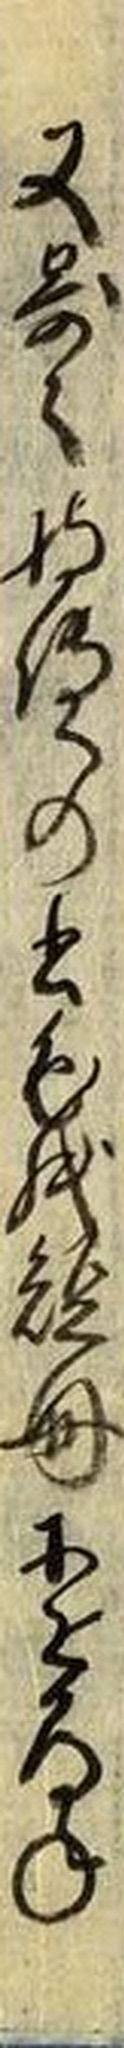又寄々持伝への書色紙短冊等を尋ね
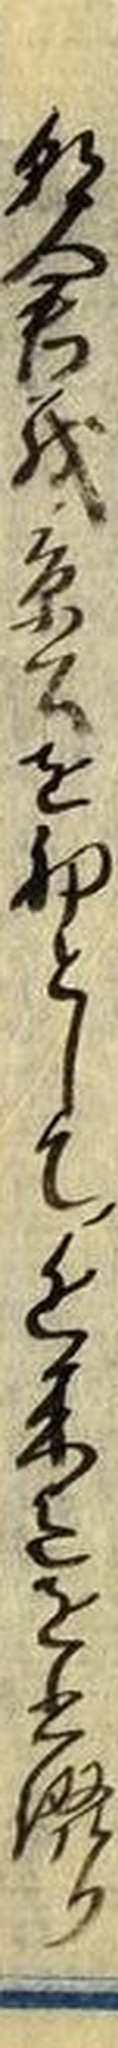朝倉義景公を初としての近来迄を書綴り
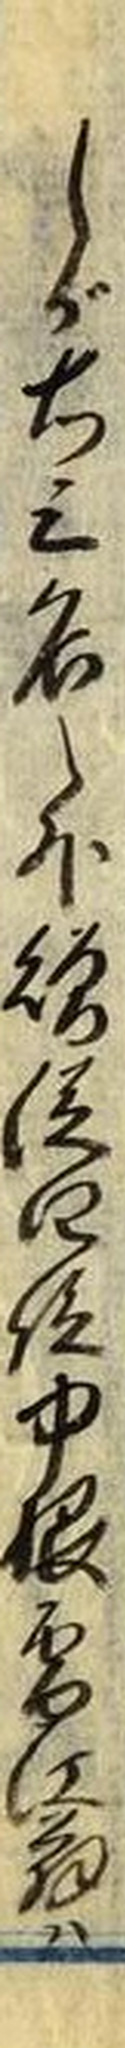しが右三名之外贈四位中根雪江翁は
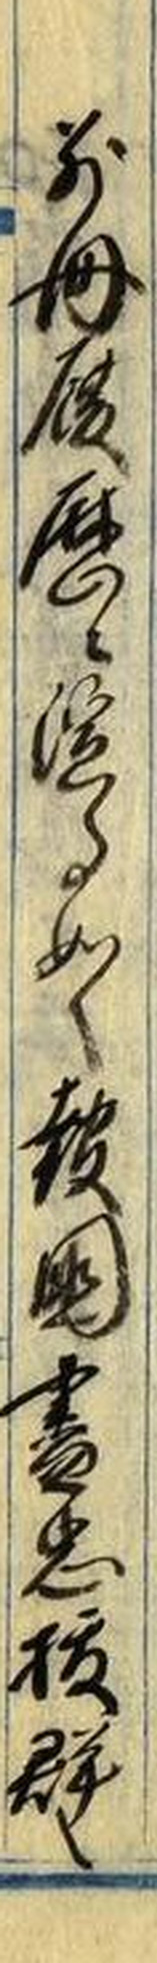別冊履歴に演る如く報国尽忠抜群之

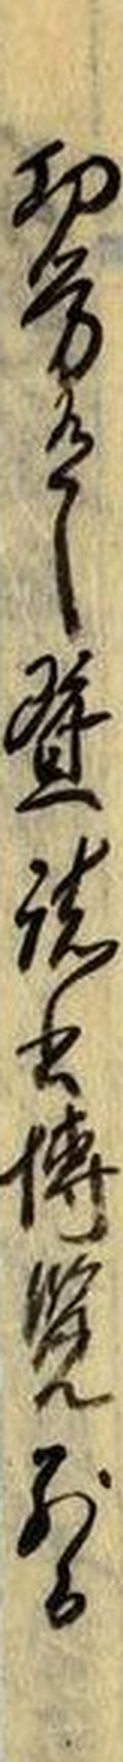功労有之曁諸書博覧別而
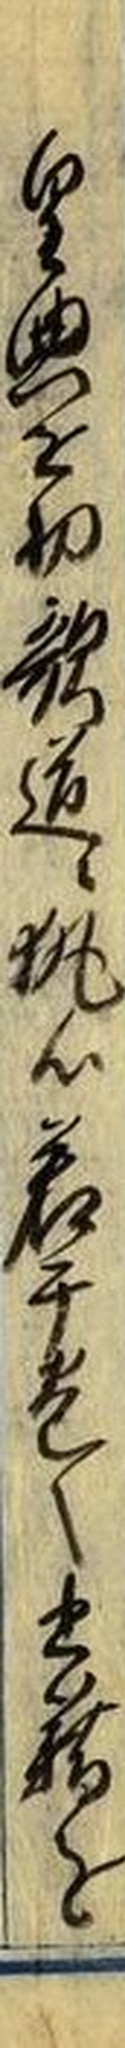皇典を初歌道に執心若干巻之書籍を
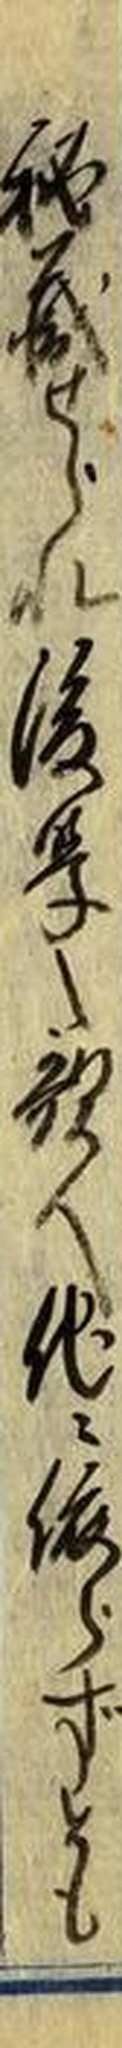秘蔵せられ後学之歌人他に依らずとも
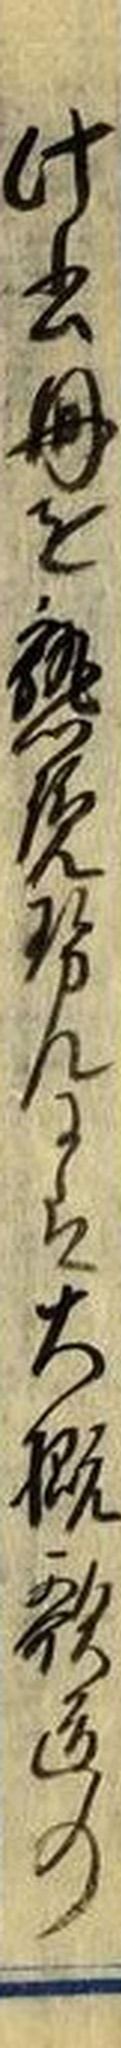此書冊を熟覧せんには大概歌道の
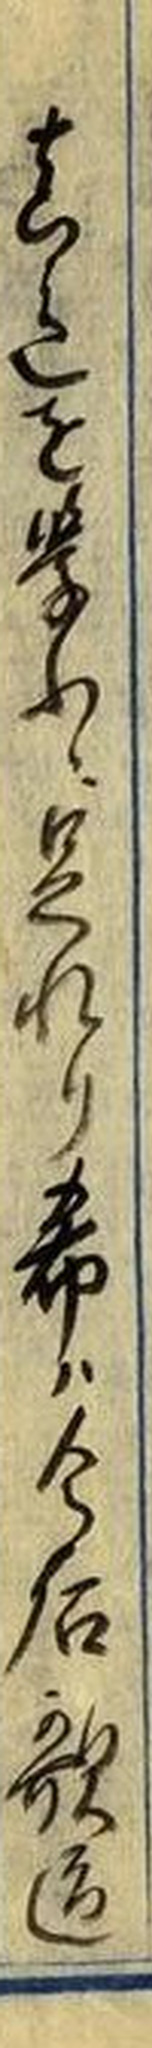真意を学ふに足れり希は今后歌道
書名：温古集 三巻
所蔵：福井県文書館 Fukui Prefectural Archives
